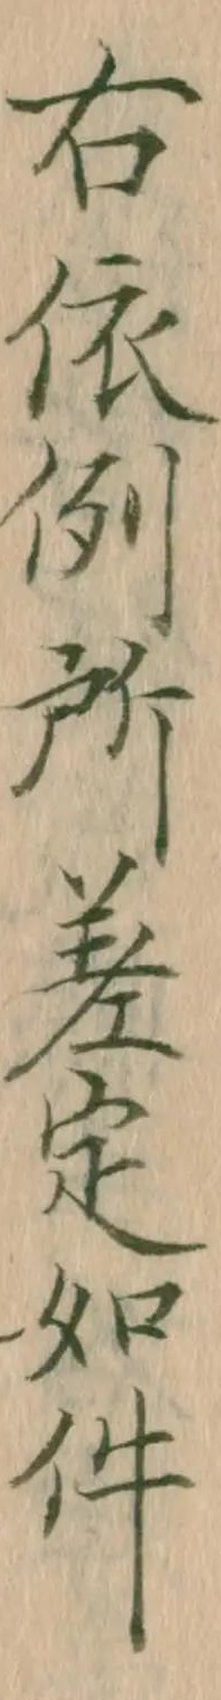右依例所差定如件
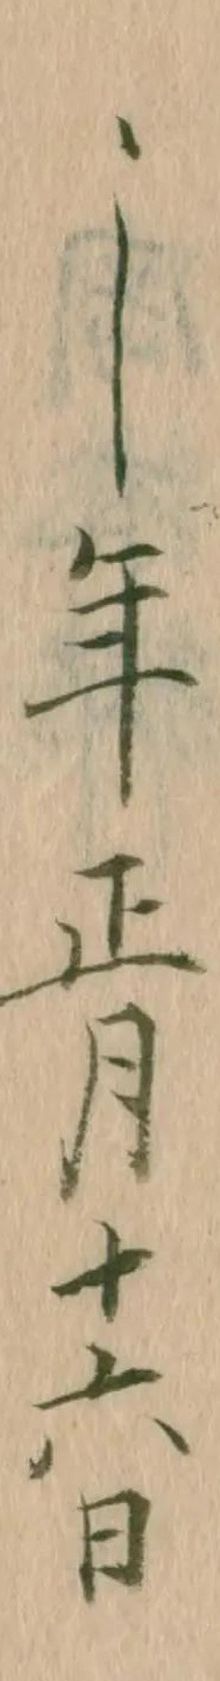――年正月十六日
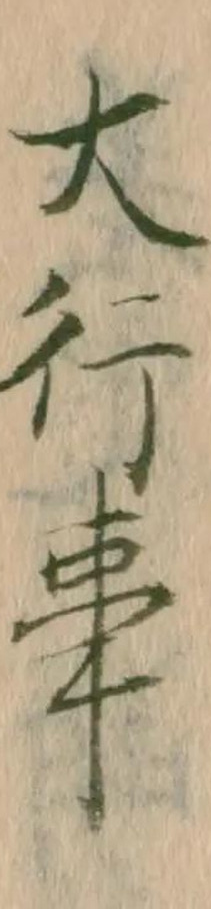大行事
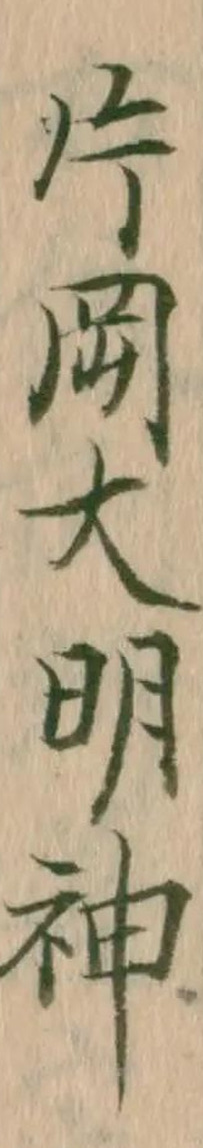片岡大明神
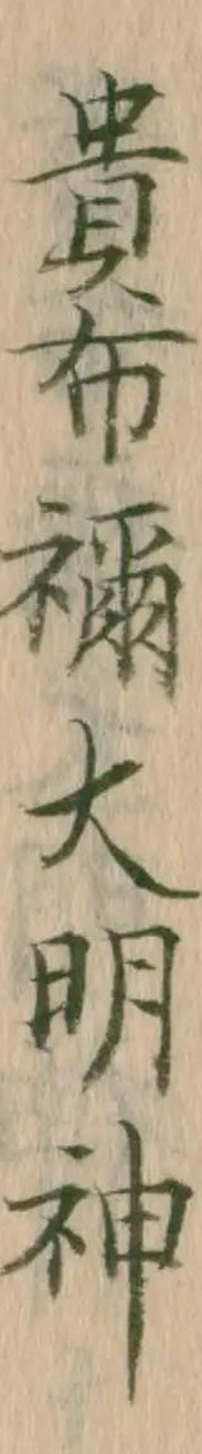貴布祢大明神
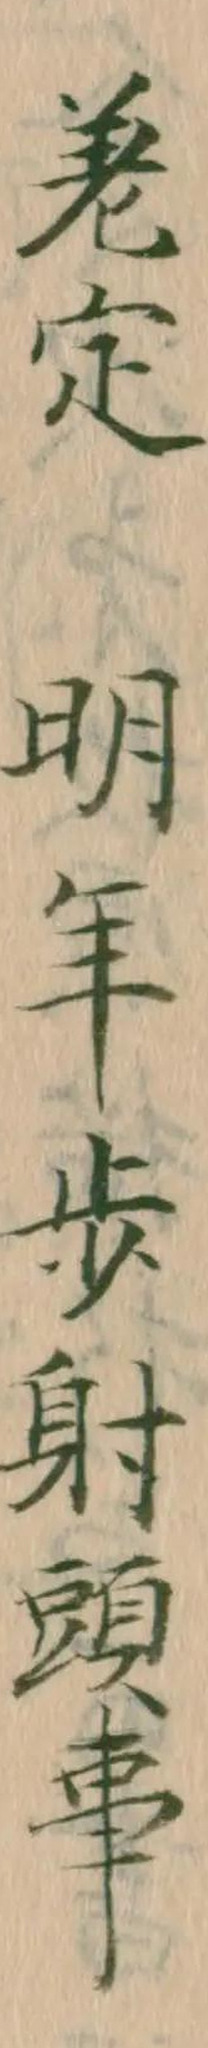差定明年歩射頭事
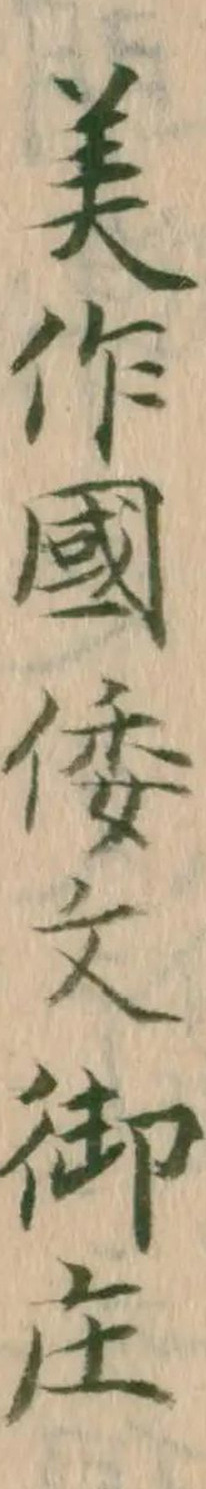美作国倭文御庄
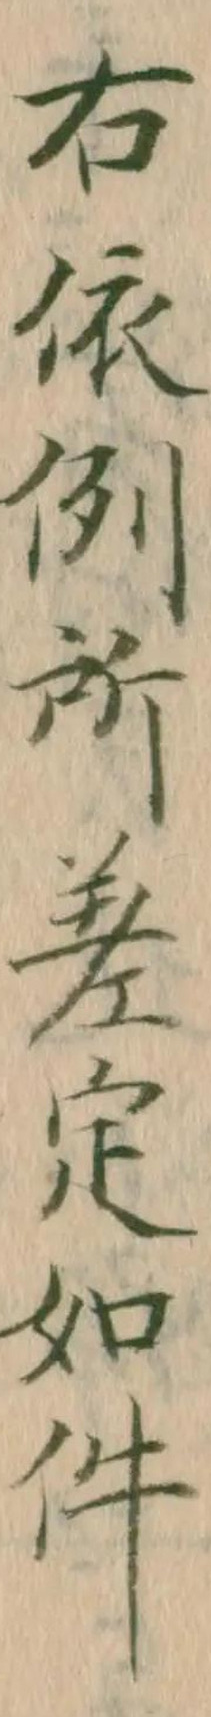右依例所差定如件
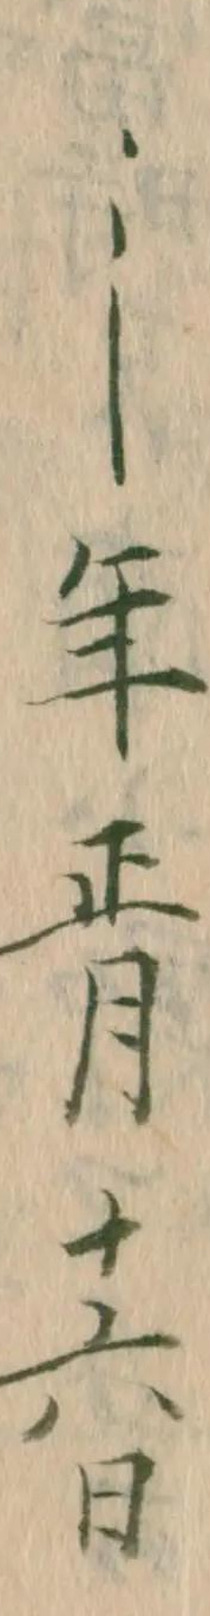――年正月十六日
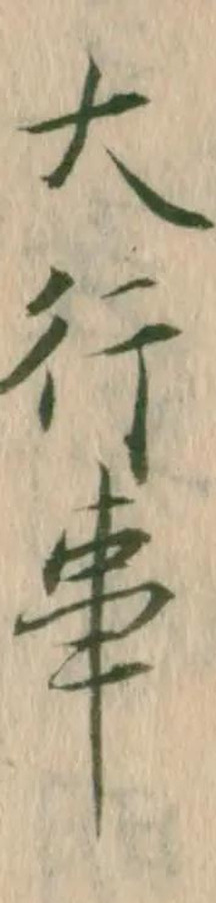大行事
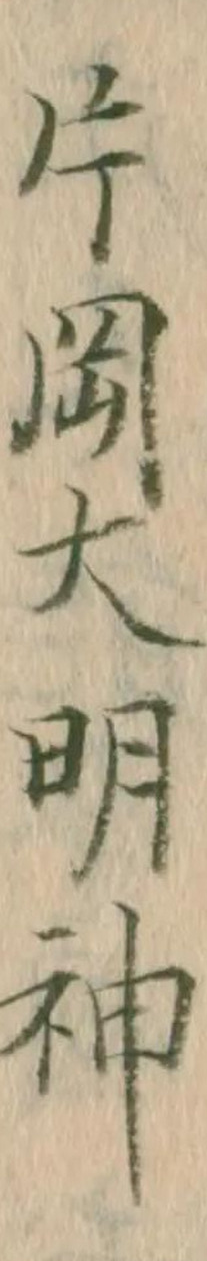片岡大明神
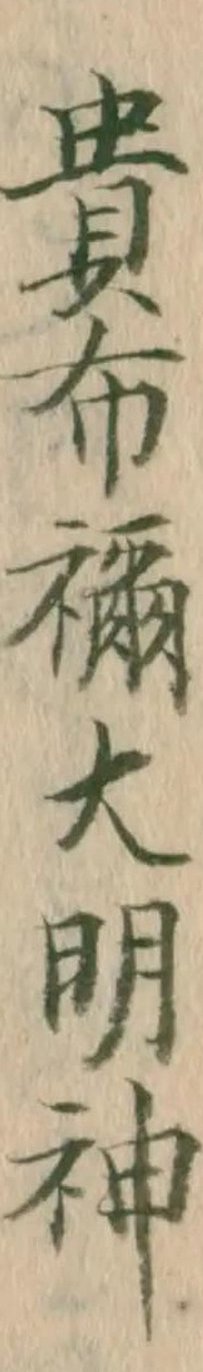貴布祢大明神
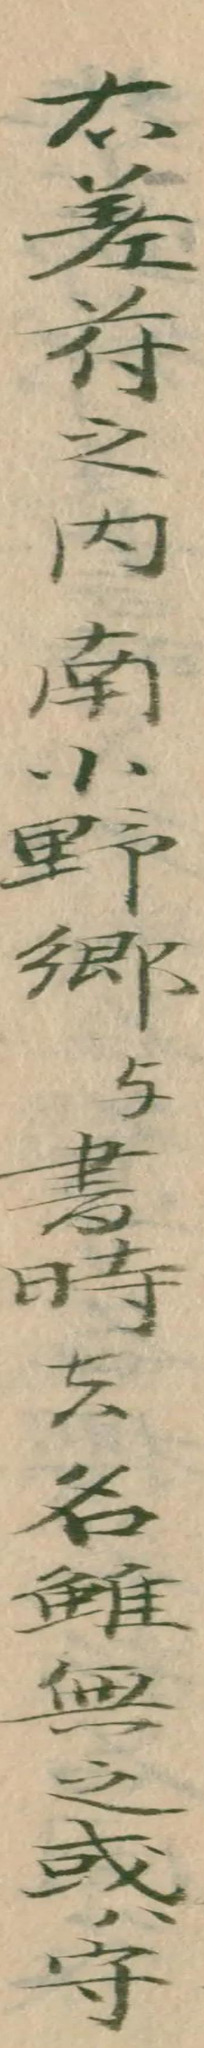一右差符之内南小野郷与書時は名雖無之或ハ守
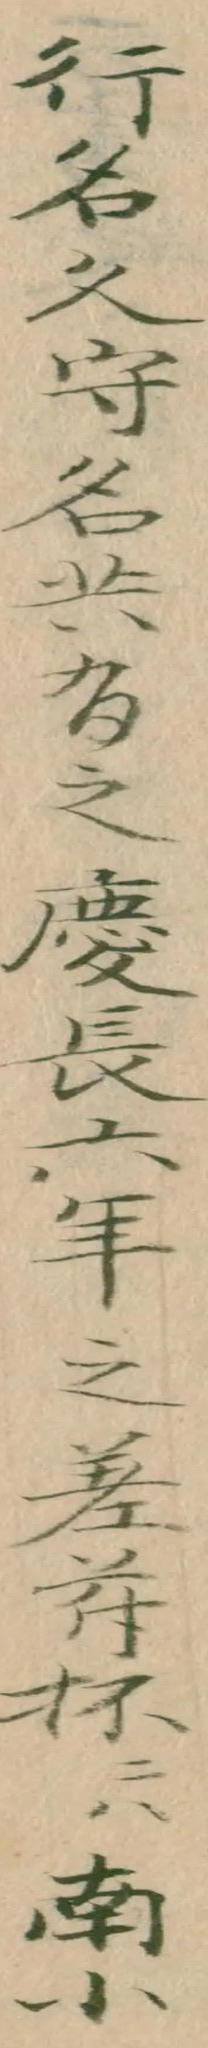行名久守名共有之慶長六年之差符抔ニハ南小
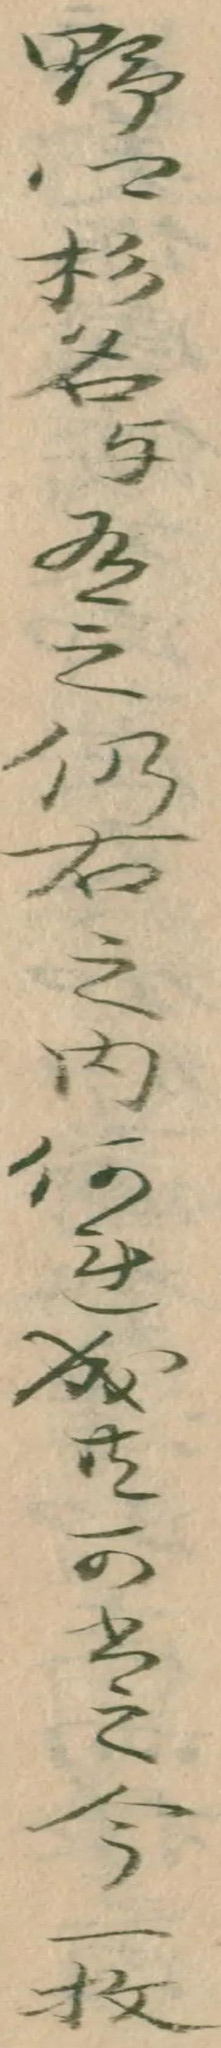野郷杉名与有之仍右之内何れ成共可書之今一枚

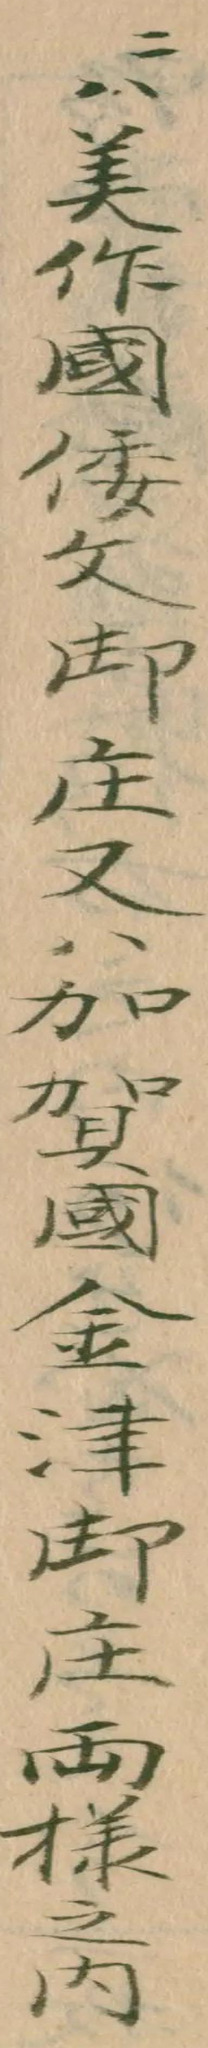ニハ美作国倭文御庄又ハ加賀国金津御庄両様之内
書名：賀茂社記録. 第26冊
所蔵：国立国会図書館 National Diet Library, JAPAN
